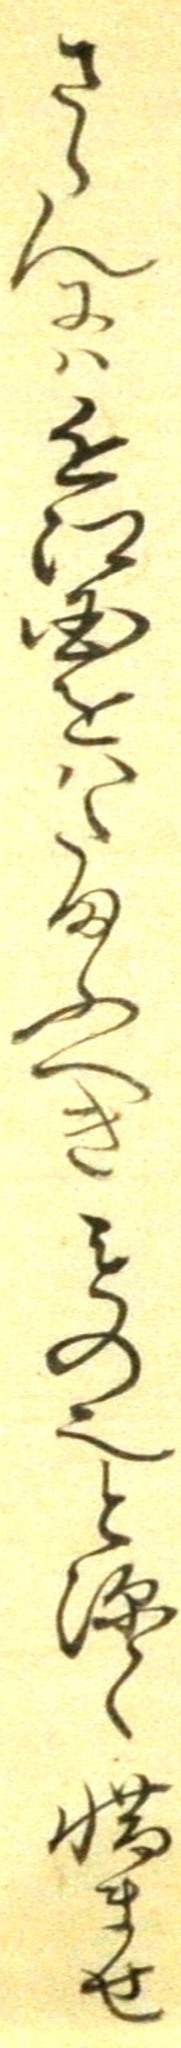さらんには近江国をはたまふへきもの也と深く惜ませ
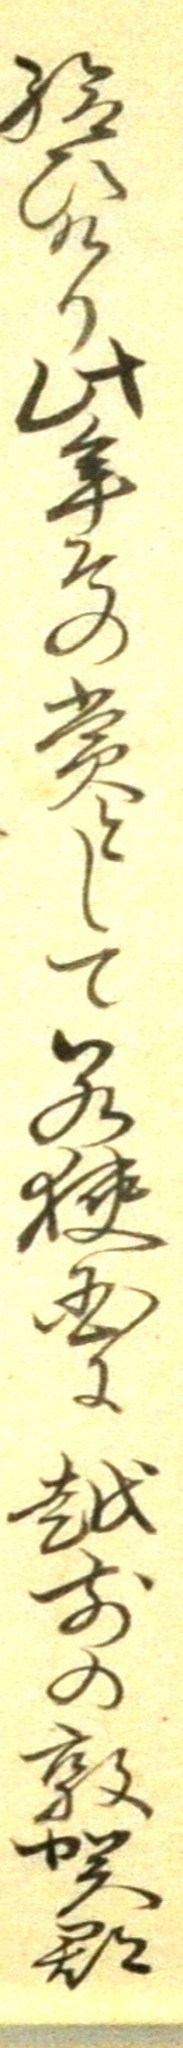給ひけり此年その賞として若狭国に越前の敦賀郡
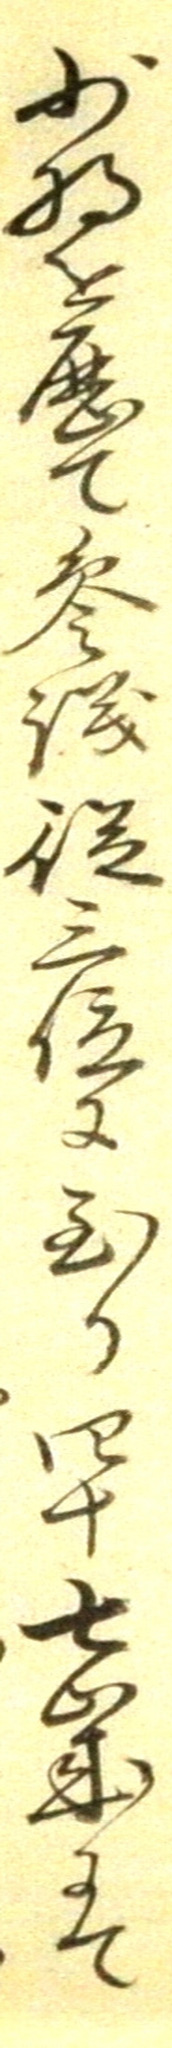少将を歴て参議従三位に至り四十七歳にて
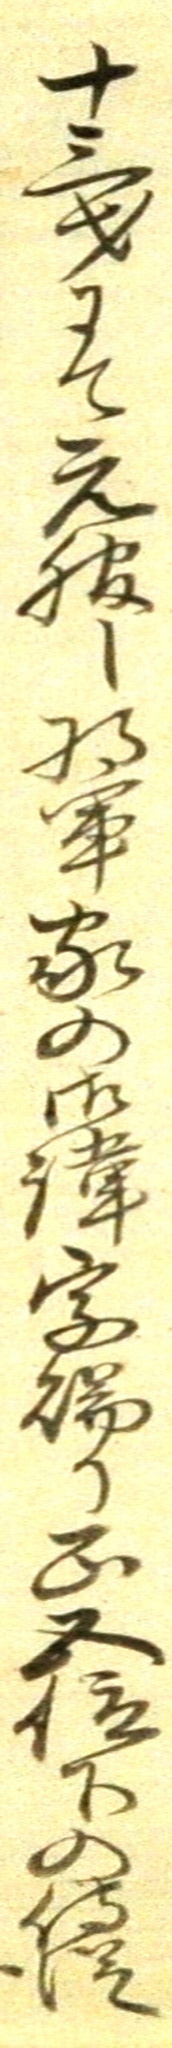十三才にて元服し将軍家の御諱字賜り正五位下の侍従
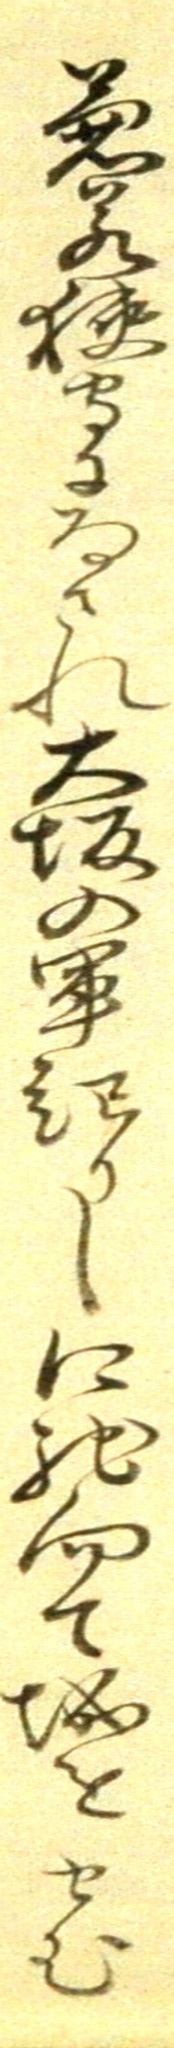兼若狭守になされ大坂の軍起りしに馳向て城をせむ
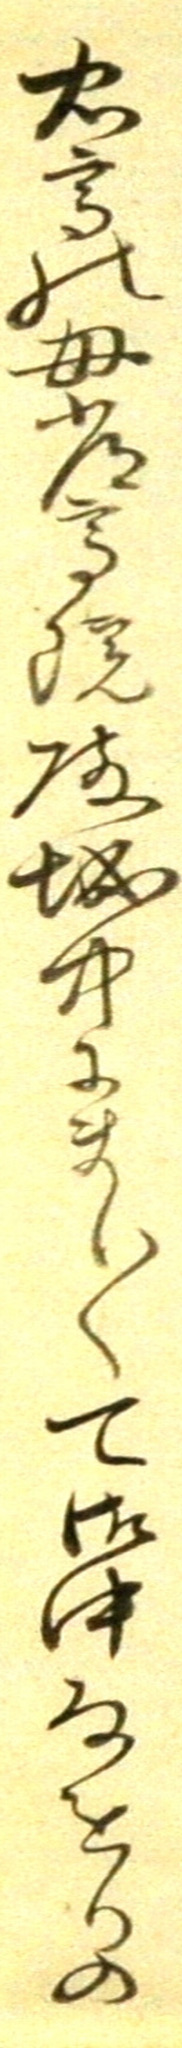忠高の母常高院殿城中にまし〳〵て御中なをりの
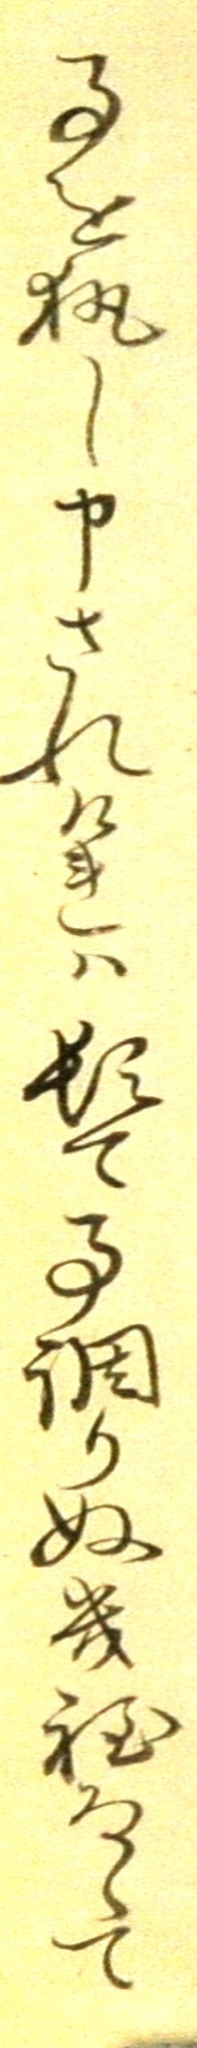事を執し申されけれは頓て事調りぬ幾程なくて

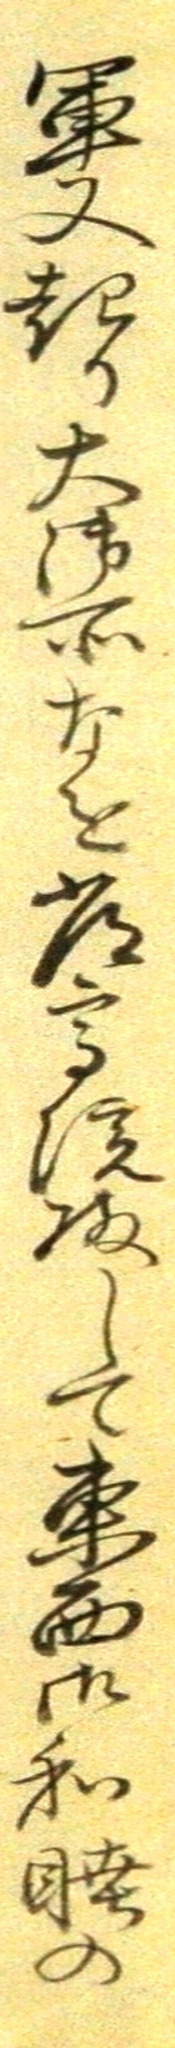軍又起り大御所なを常高院殿して東西御和睦の
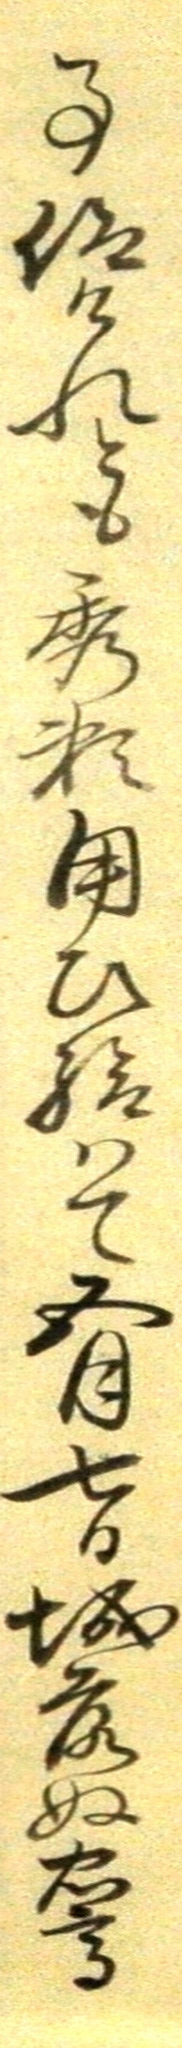事仰けれとも秀頼用ひ給はて五月七日城落ぬ忠高
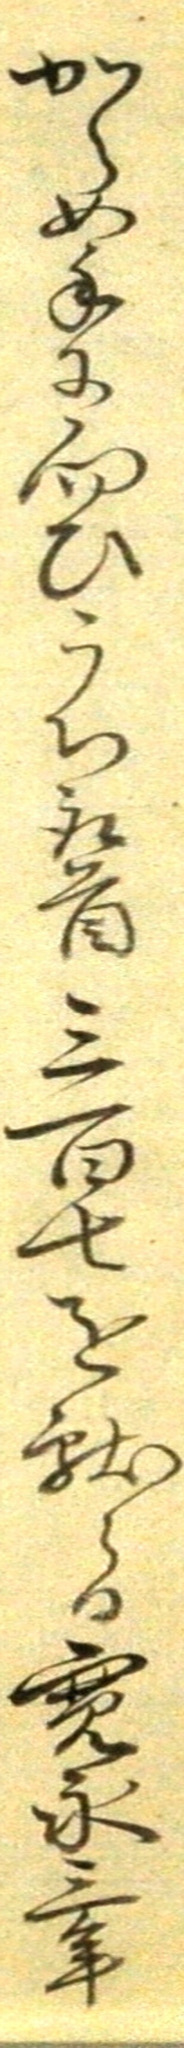からめ手に向ひうち取首三百七を献らる寛永三年
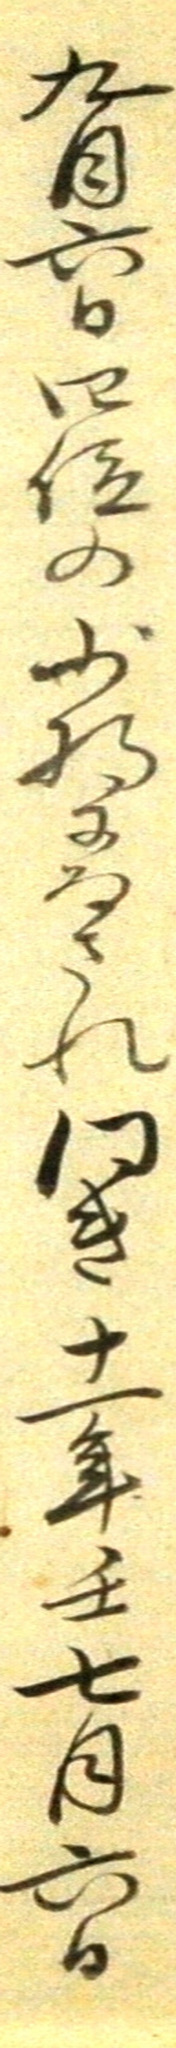九月六日四位の少将になされ同き十一年壬七月六日
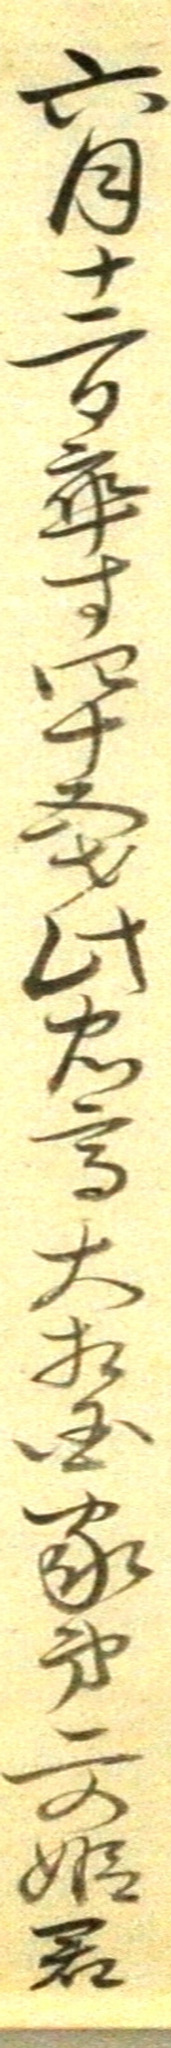六月十二日卒す四十五才此忠高大相国家第二の姫君
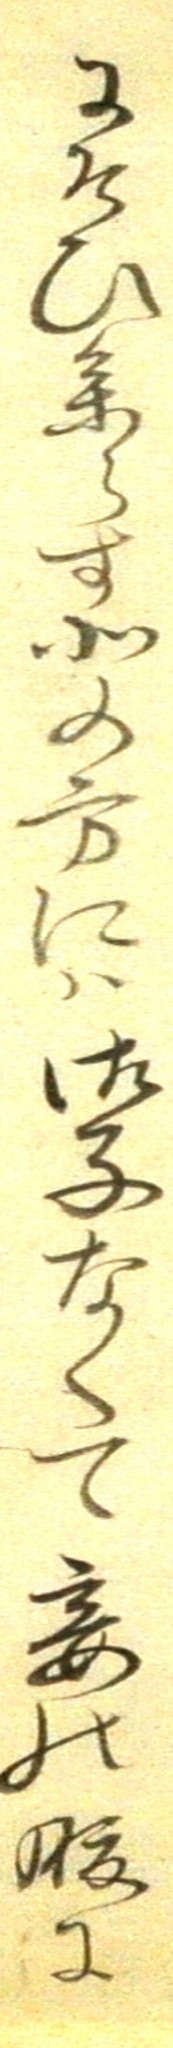にそひさ参らす北の方には御子なくて妾の腹に
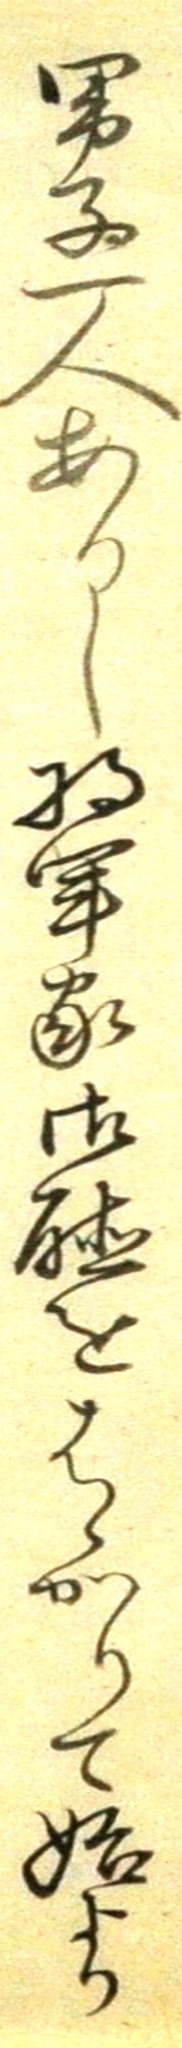男子一人ありし将軍家御聴をはゝかりて始より
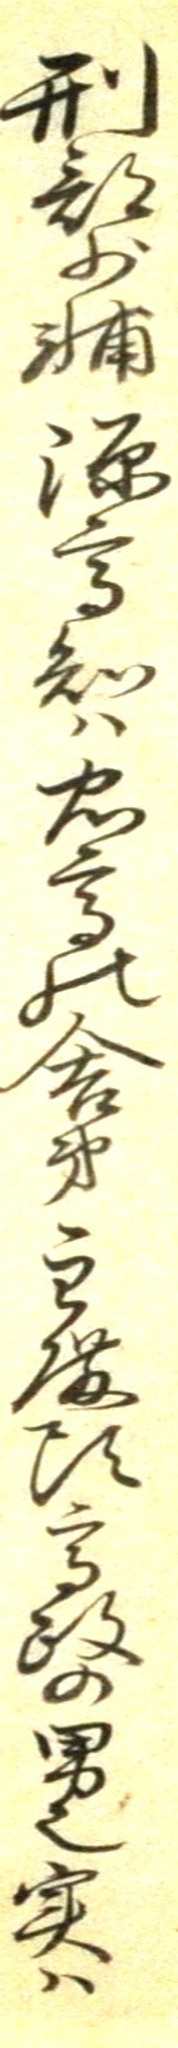刑部少輔源高知は忠高の舎弟主殿頭高政の男也実は
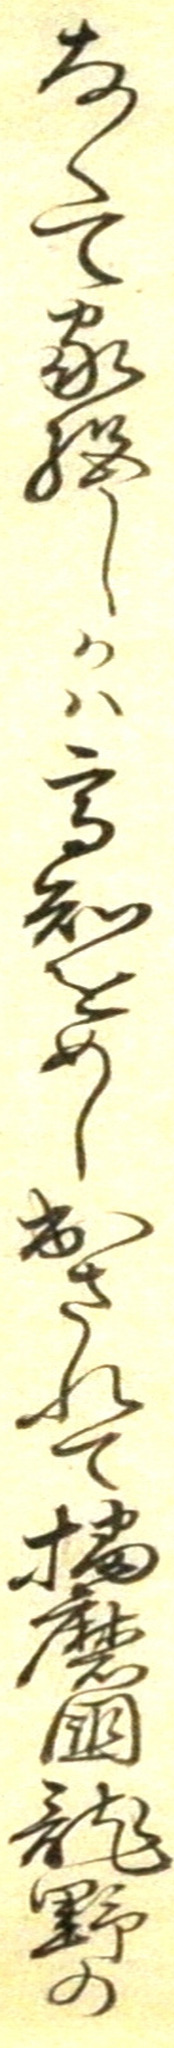なくて家絶しかは高知をめし出されて播磨国竜野の
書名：藩翰譜（七・上）
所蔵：伊那市立高遠町図書館・合同会社AMANE
